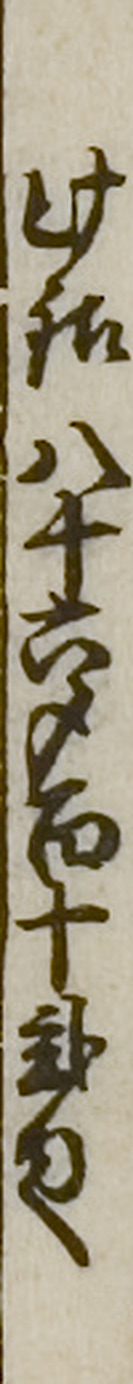此銀八十六貫百十弐匁
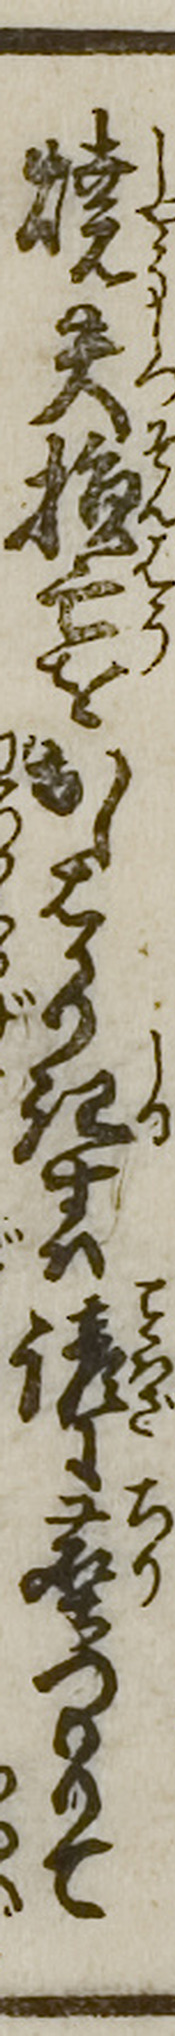焼失損亡をおしはかり記すは諺に塵つもりて
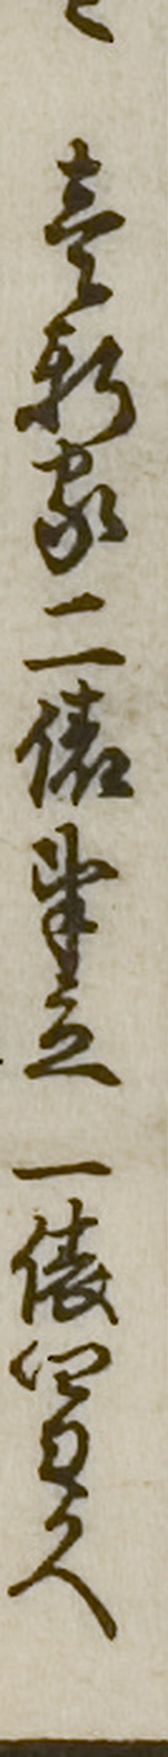炭壱軒家二俵半立一俵四匁かへ
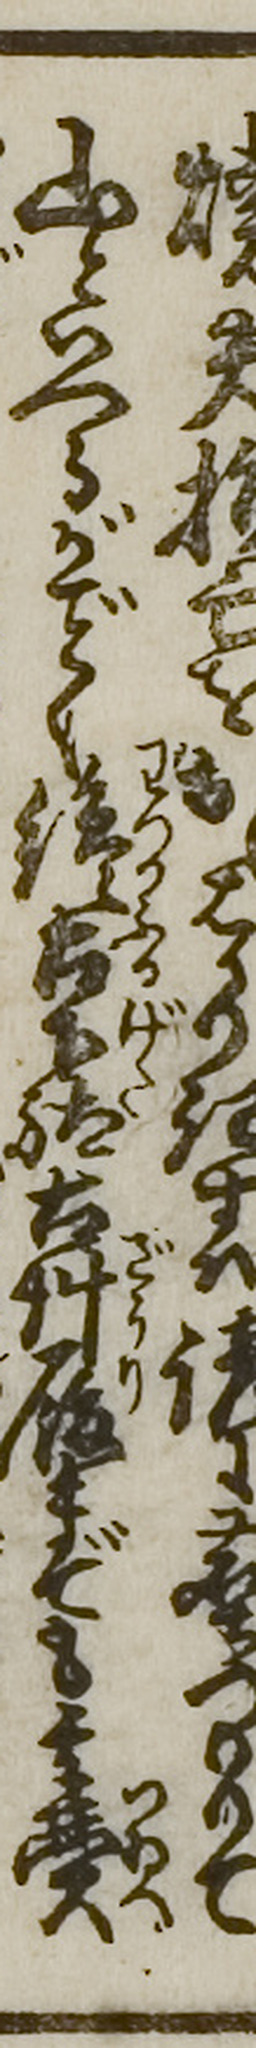山といへるがごとく纔古下駄古草履までも其費
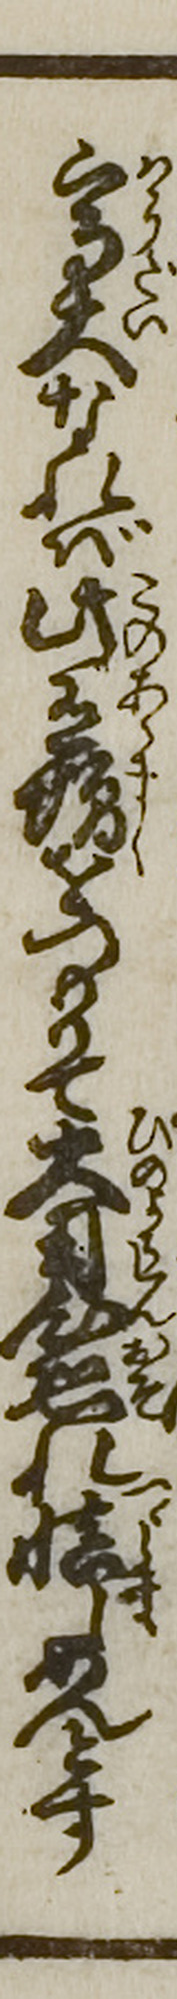高大なれば此有増をつもりて火用心恐れ慎しめんとす
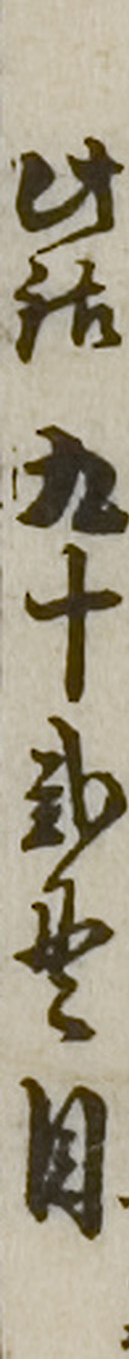此銀九十弐貫目
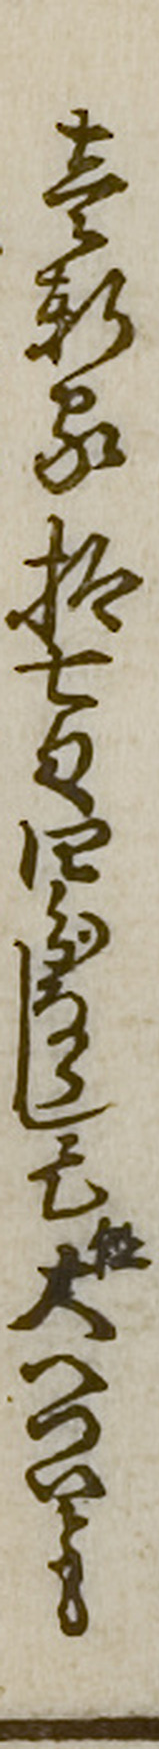へつい壱軒家拾七匁四分ならしにて但大へついとも
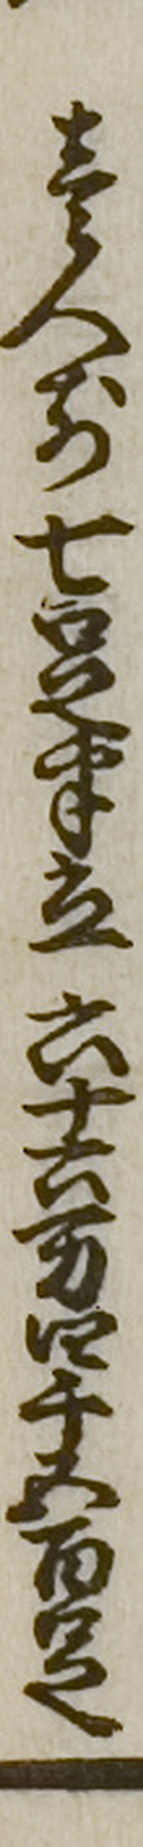下駄壱人前七足半立六十六万四千五百足
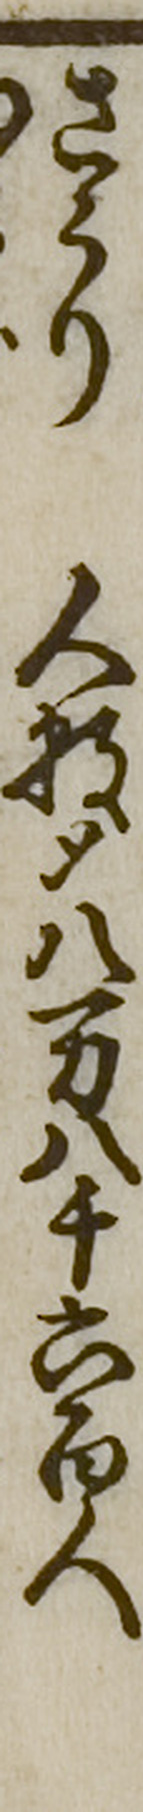さうり人数〆八万八千六百人
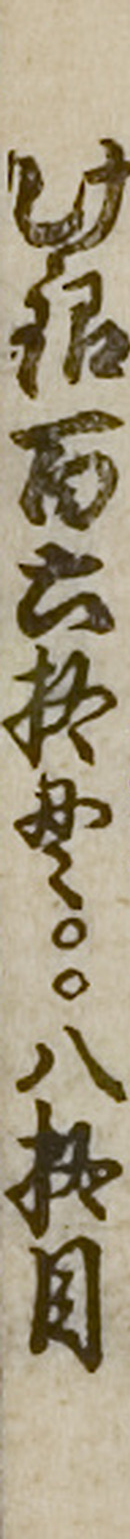此銀百六拾貫○○八拾目
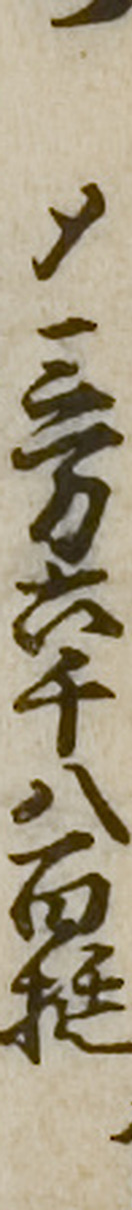〆三万六千八百挺
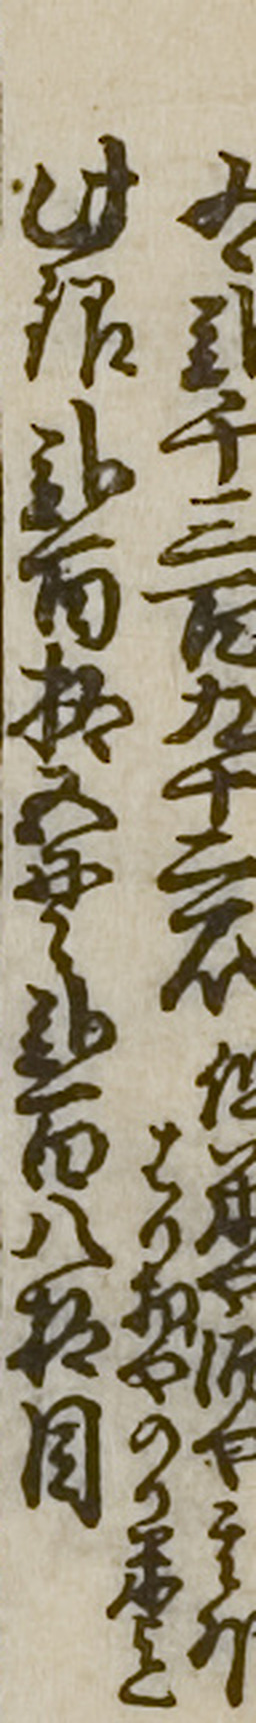此銀弐百拾五貫弐百八拾目
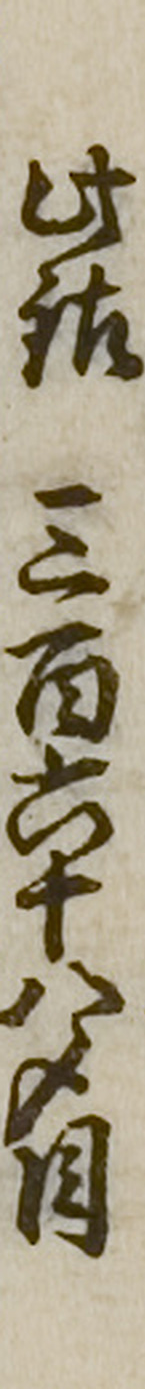此銀三百六十八貫目
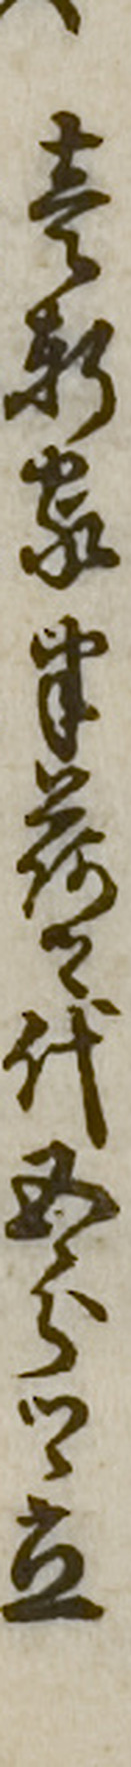下糞壱軒家半荷ツヽ代五分ツヽ立
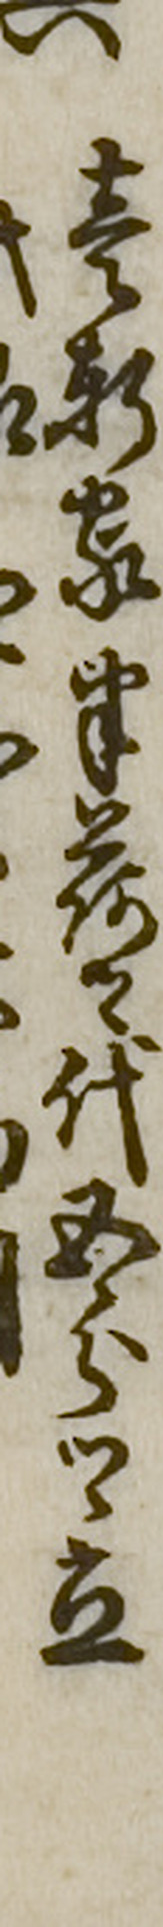下糞壱軒家半荷ツヽ代五分ツヽ立
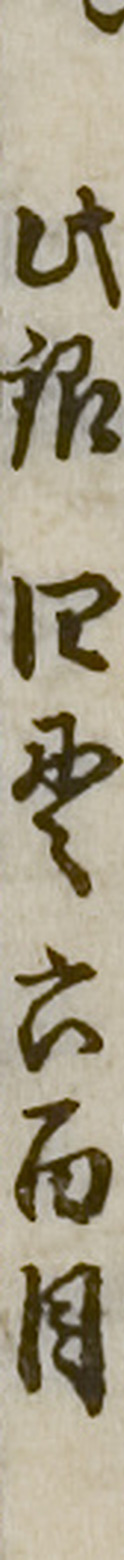此銀四貫六百目
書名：上京火災町家雑具損亡考記
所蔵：東京大学総合図書館 General Library in the University of Tokyo, JAPAN
